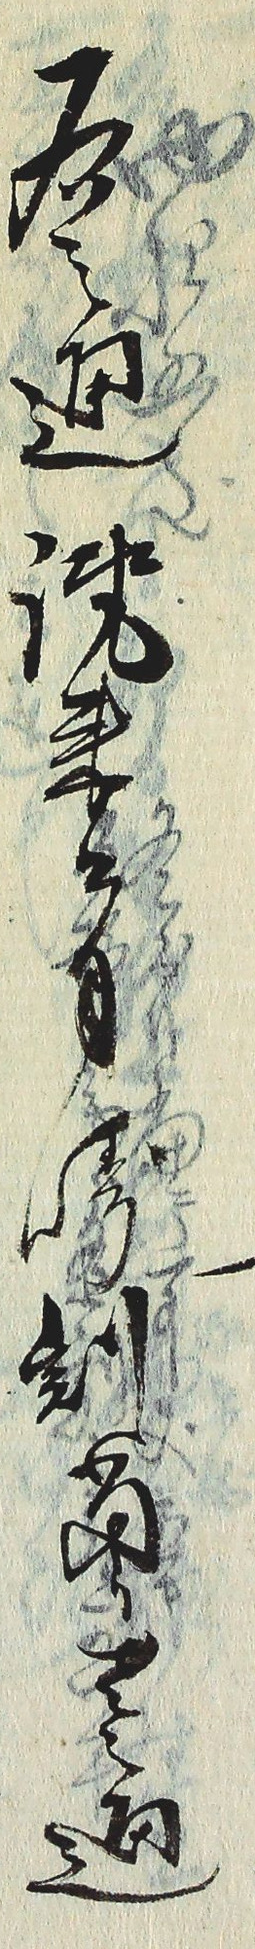右之通誂来候手崎割当り左之通
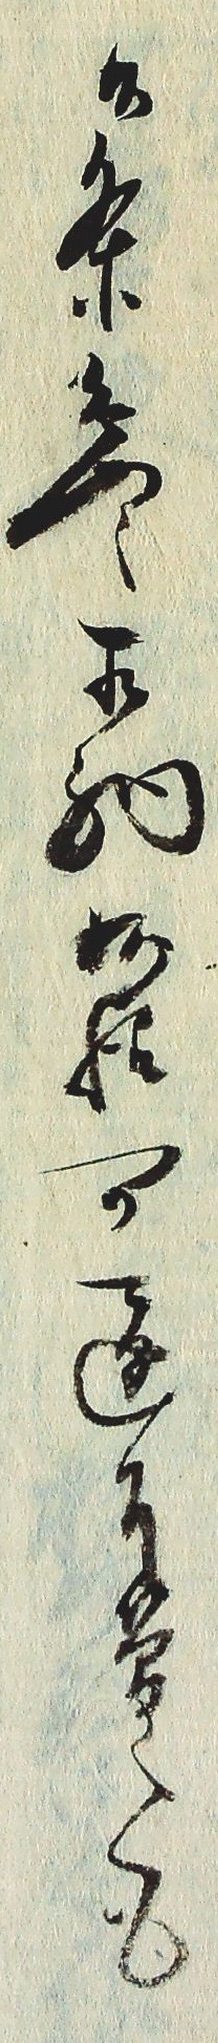候条急々相納候様可遂了簡候以上
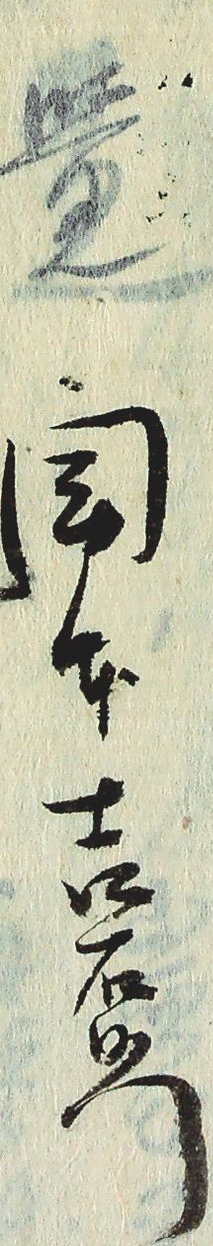岡本吉右衛門
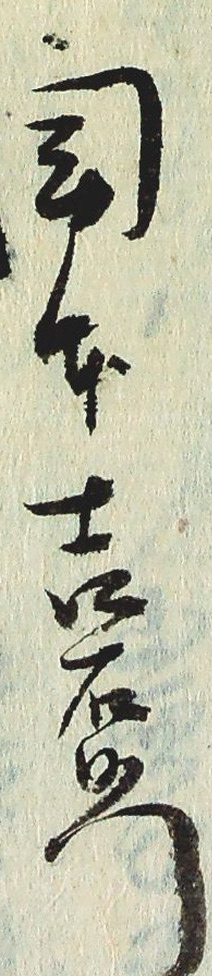岡本吉右衛門
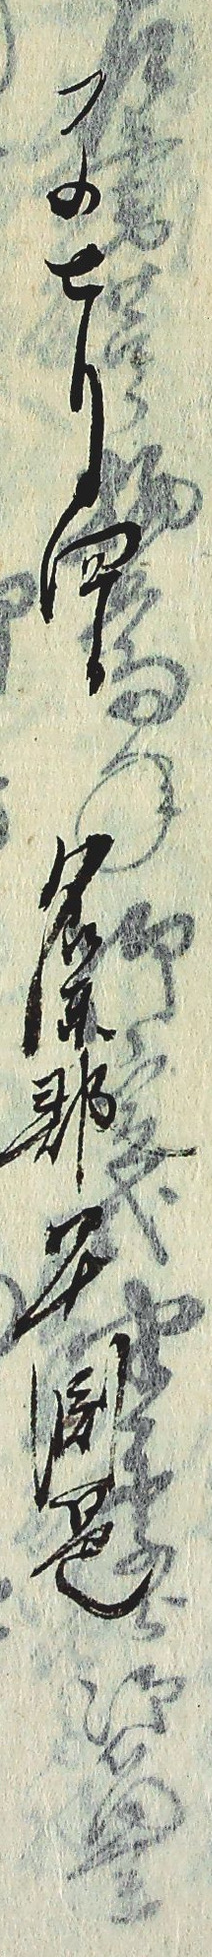子七月四日名東郡早淵邑
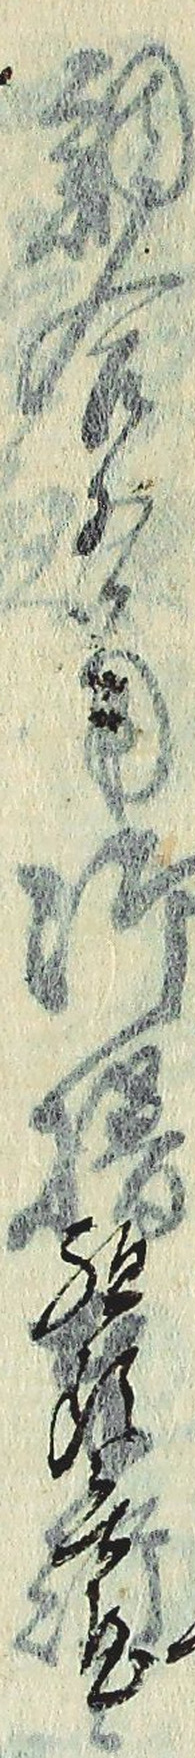組頭庄屋
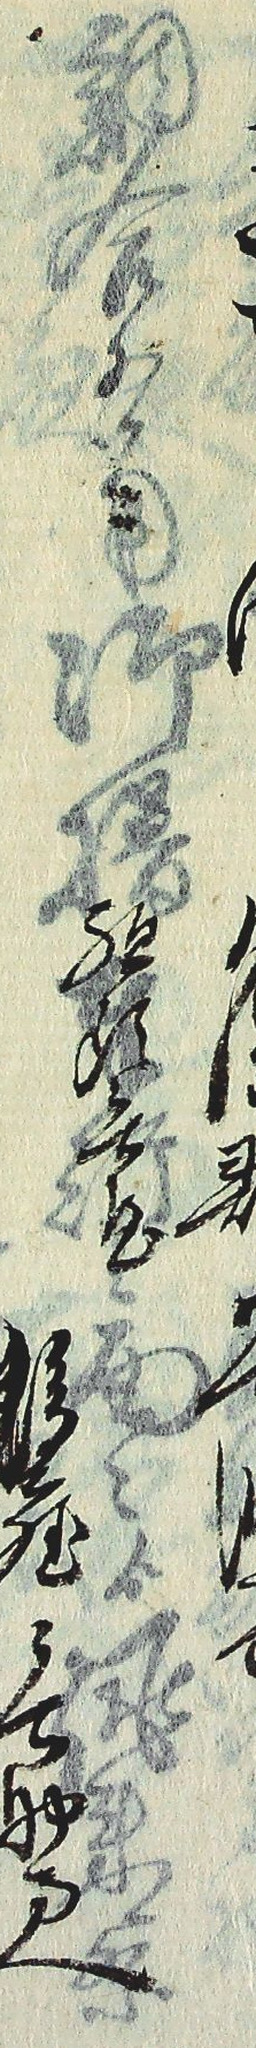後藤庄助方へ
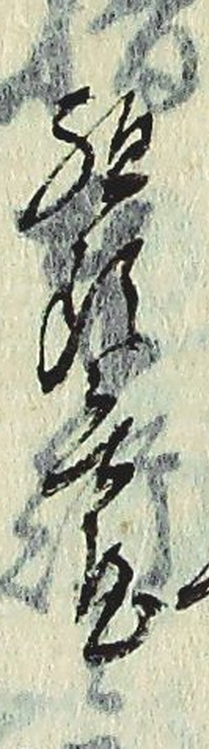組頭庄屋
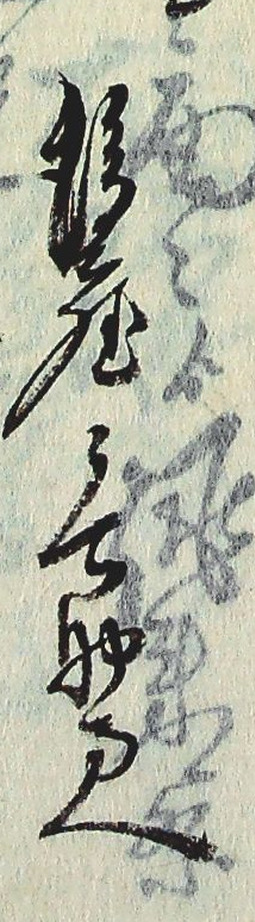後藤庄助方へ
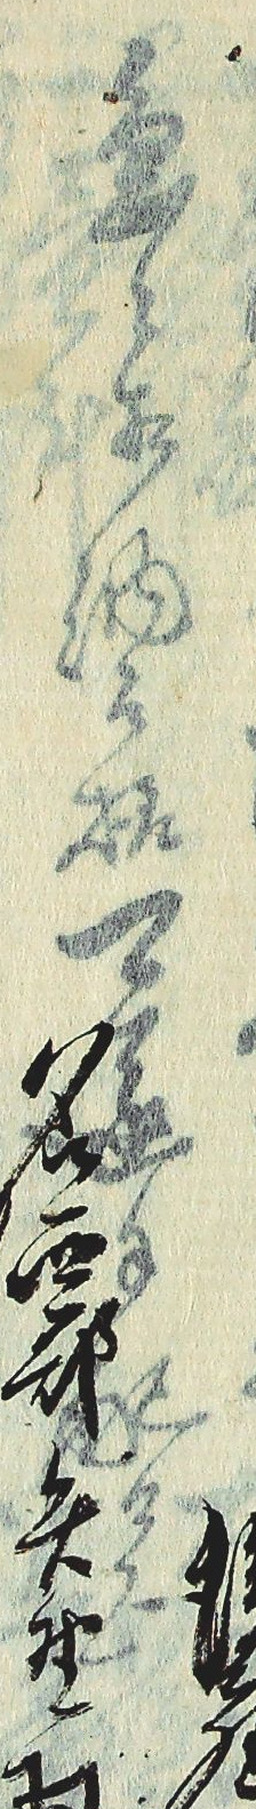名西郡矢野村
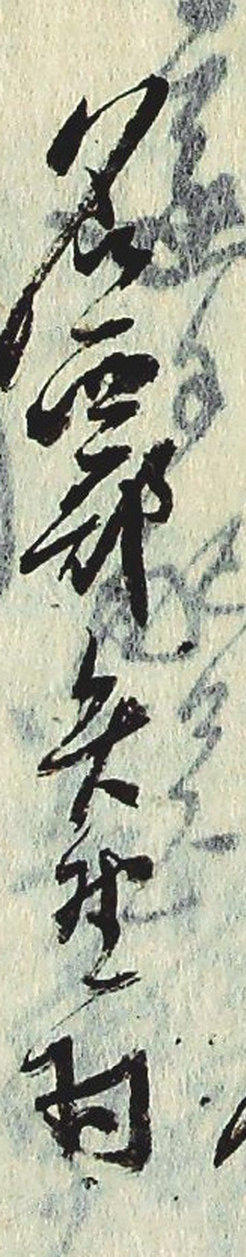名西郡矢野村
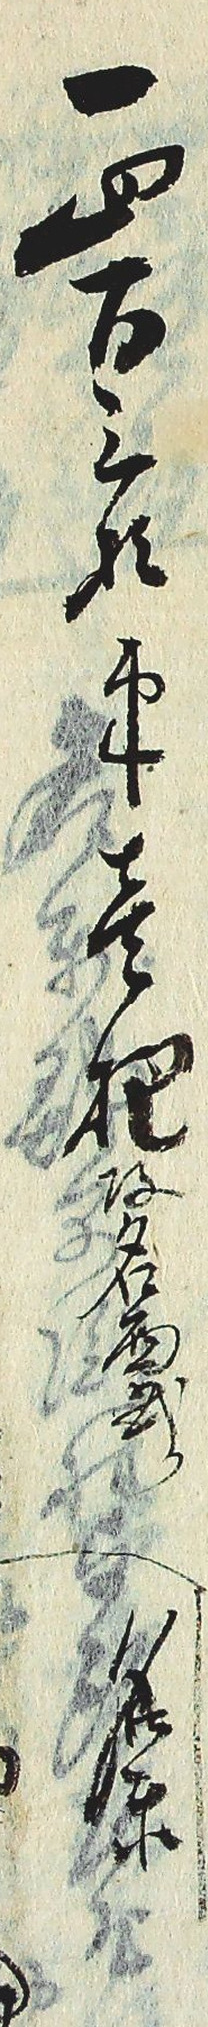一四百三拾束壱把改名西当り名東

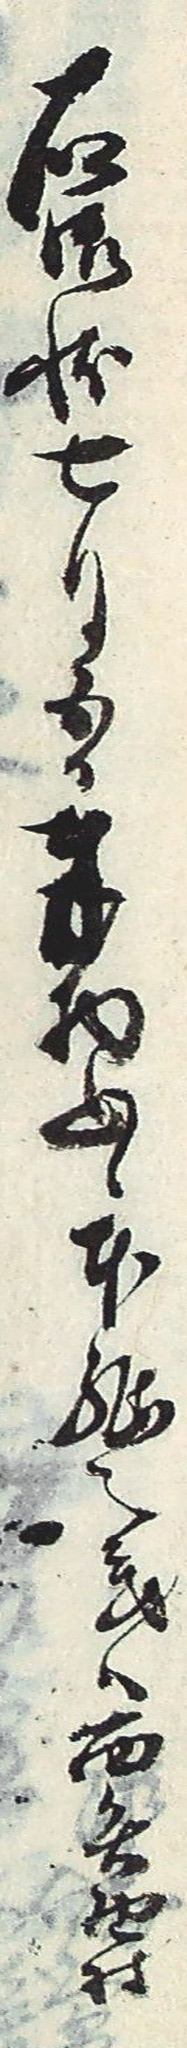右御状七月五日奉拝上候本紙之義は西矢野村
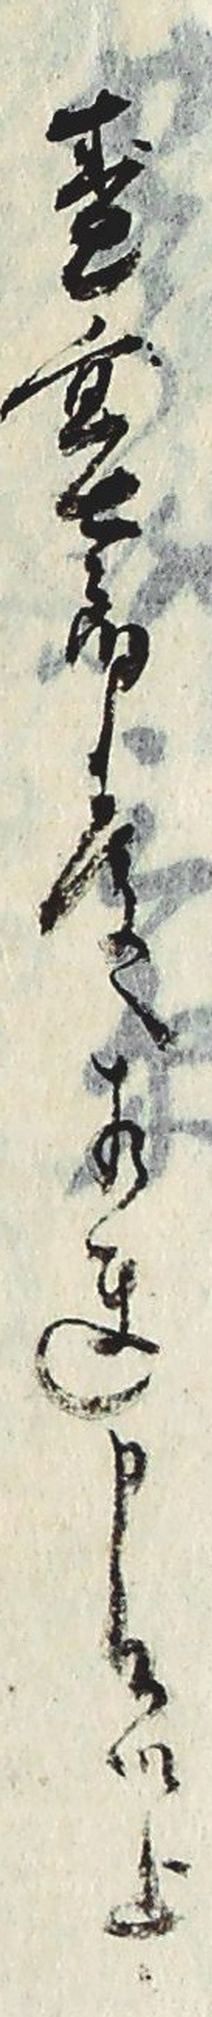盛宣七郎殿へ相達申候以上
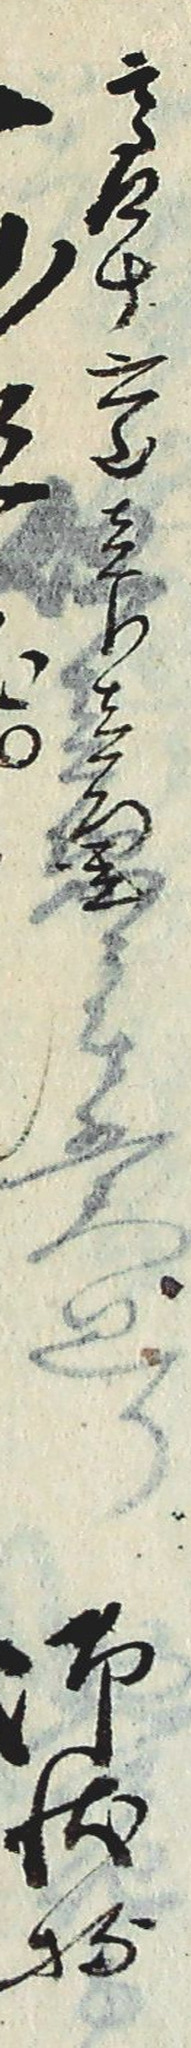高四十六匁壱分壱厘御状持
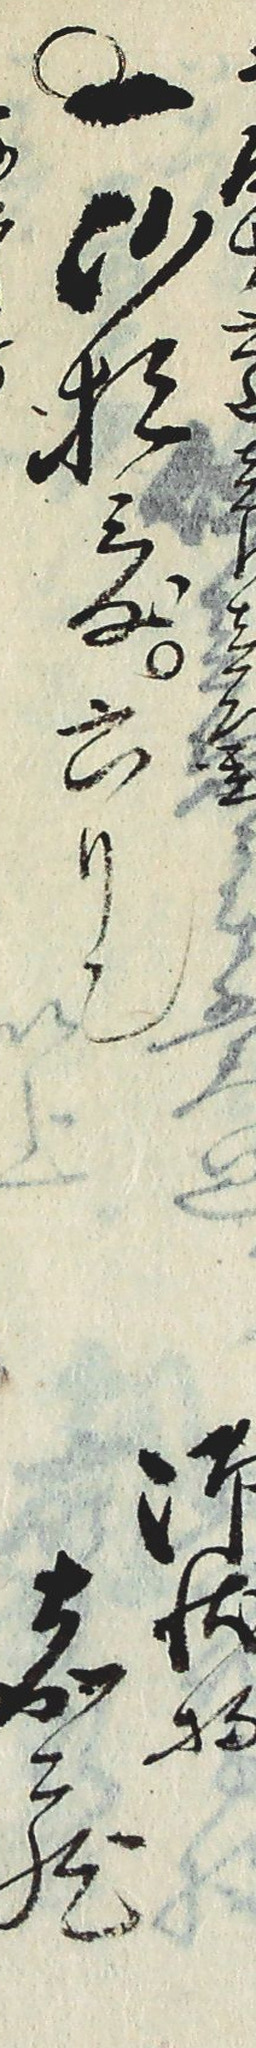一弐拾三匁〇六厘也嘉蔵
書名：名東郡中諸割賦元帳
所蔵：鳴門教育大学 Naruto University of Education
